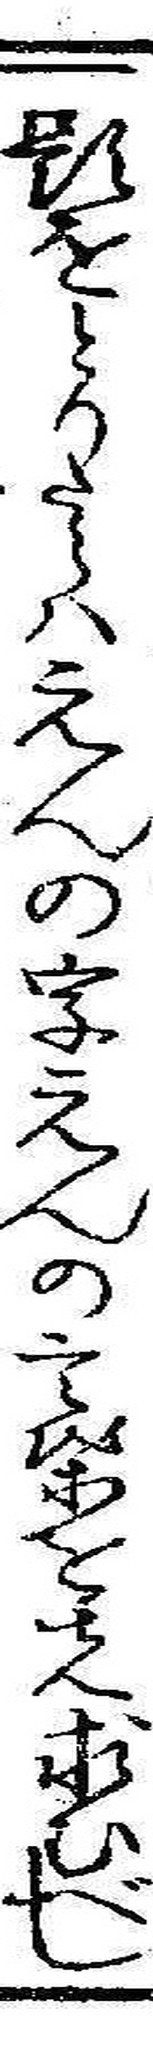一題をとりたらはえんの字えんの言葉を先へ求むべし
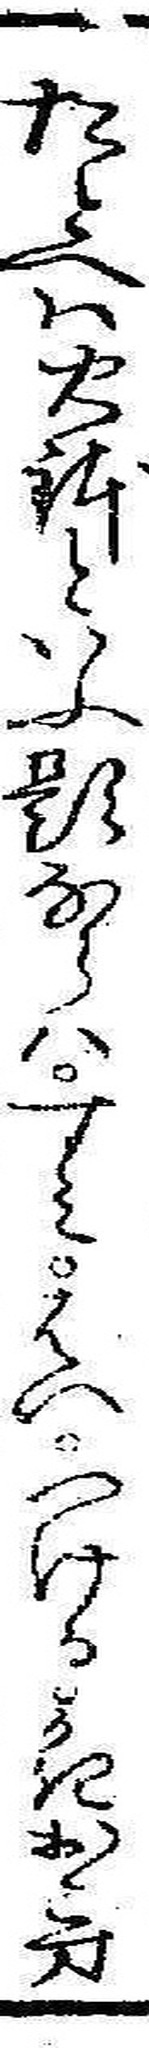たとへは火鉢といふ題ならは◦すみ◦はい◦つける◦かきおこす
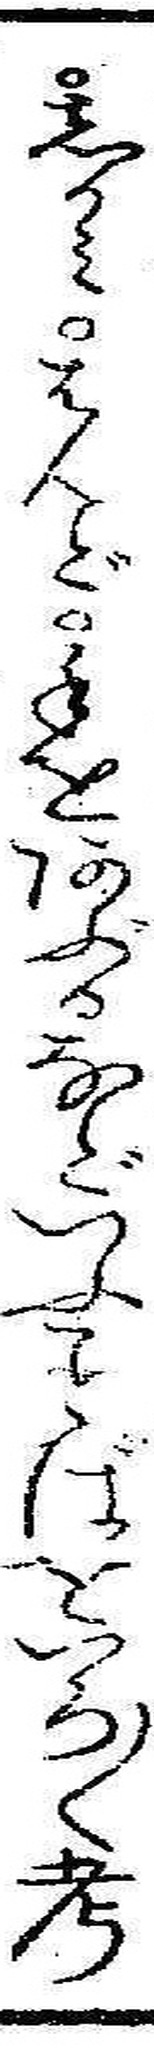◦しかみ◦はんど◦手をあぶるなどいふことばをいろ〳〵
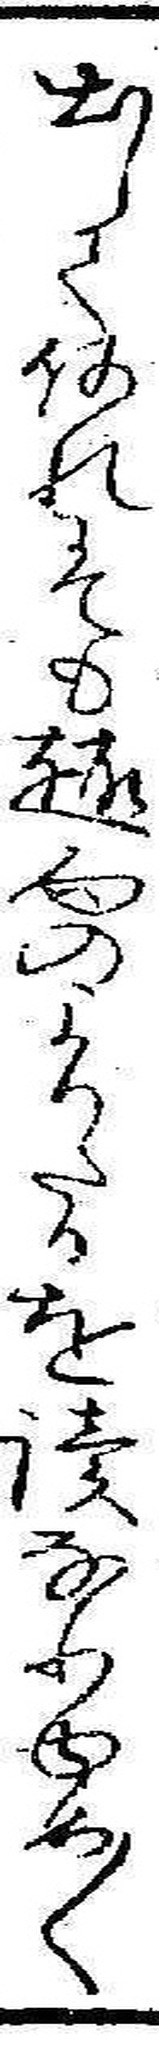出して何れにても趣向のよりたるを読なりゆめ〳〵
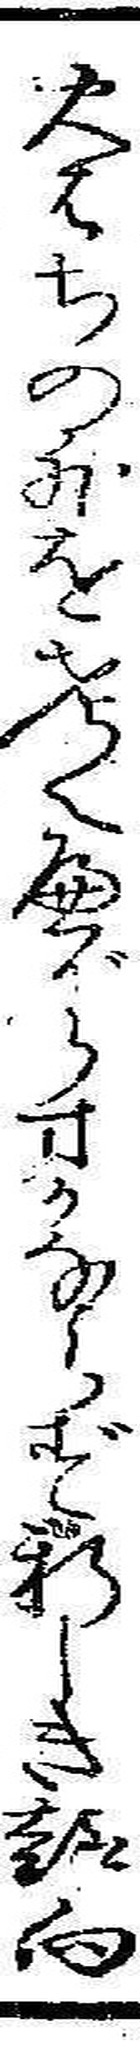火はちの外を考えべからすかならずあたらしき趣向
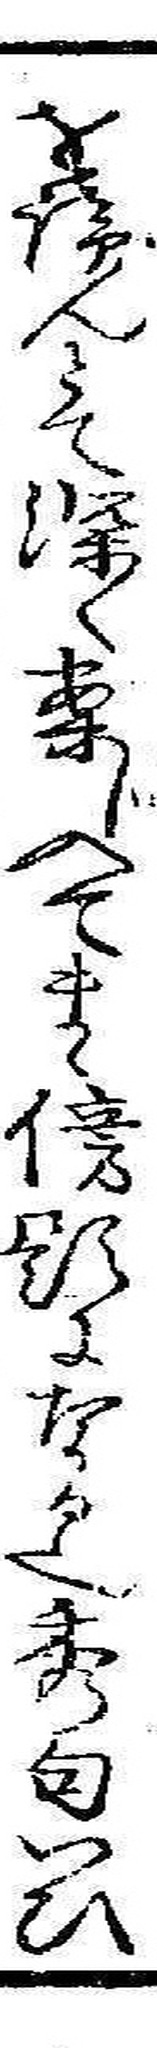を読とて深く案じ入てまゝ傍題になる也秀句いひ
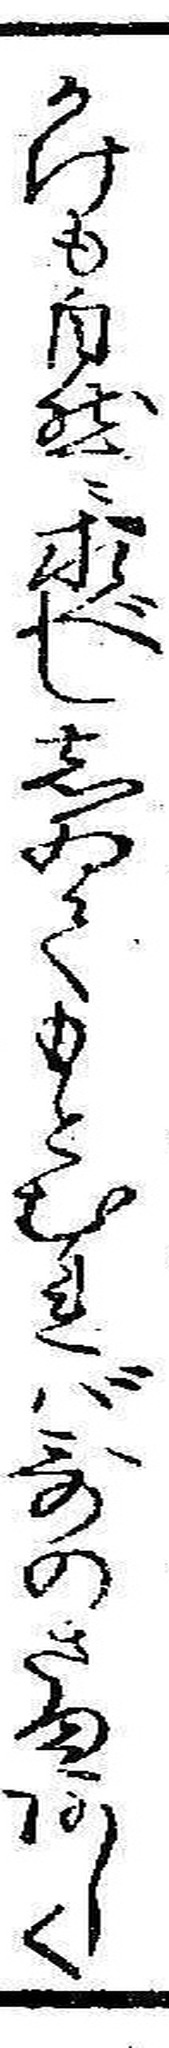かけも自然に求べししゐてもとむれば歌のさまあしく
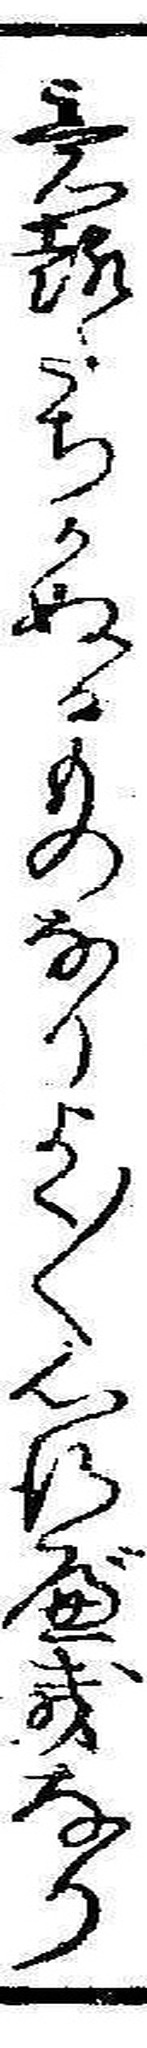意趣たちかぬるものなりよく〳〵心得べきなり
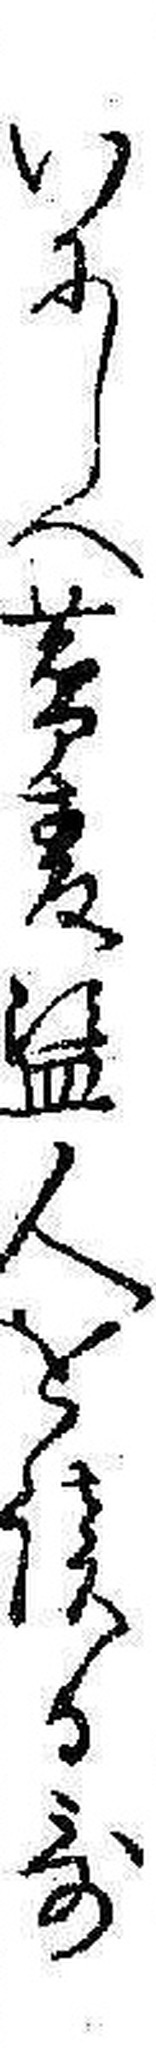いにしへ蕎麦盗人を読る歌
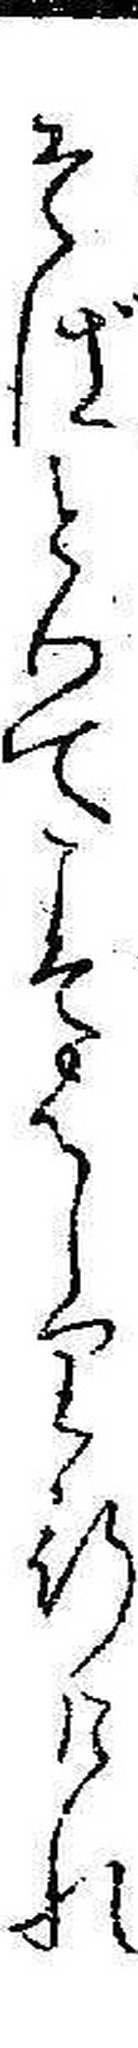そばとつてこそはしり行けり
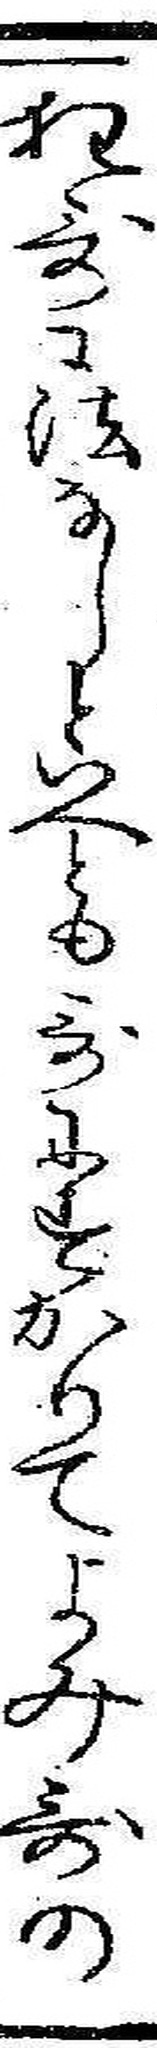一狂歌に法なしといへとも歌にすかりてよみ歌の
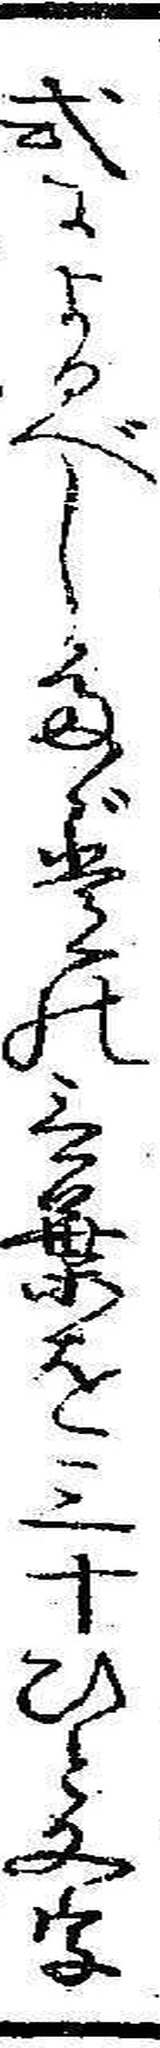式によるべしただの言葉を三十ひと文字
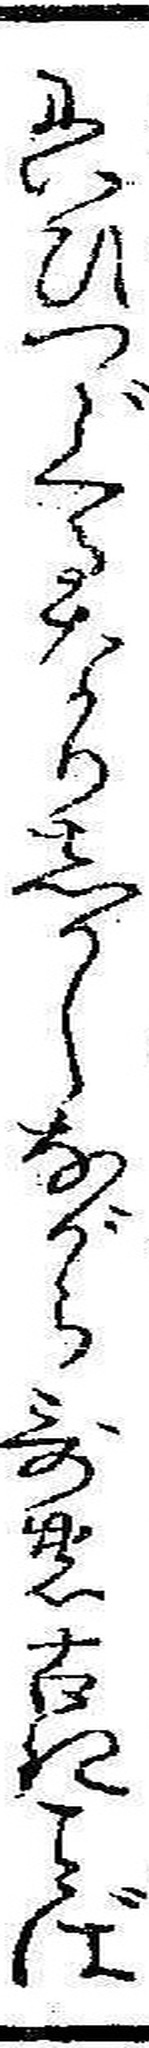にいひつぐるなりしかしながら歌の古きことば
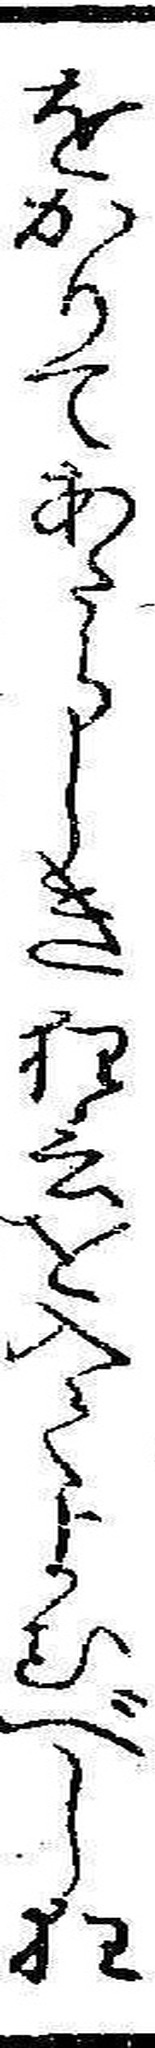をかりてあたらしき狂言を入てよむべし狂
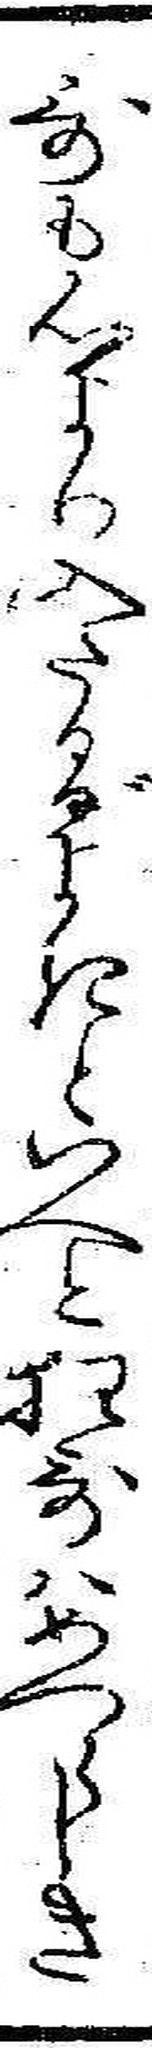歌も心より入たるがよきといへと狂歌はめつらしき
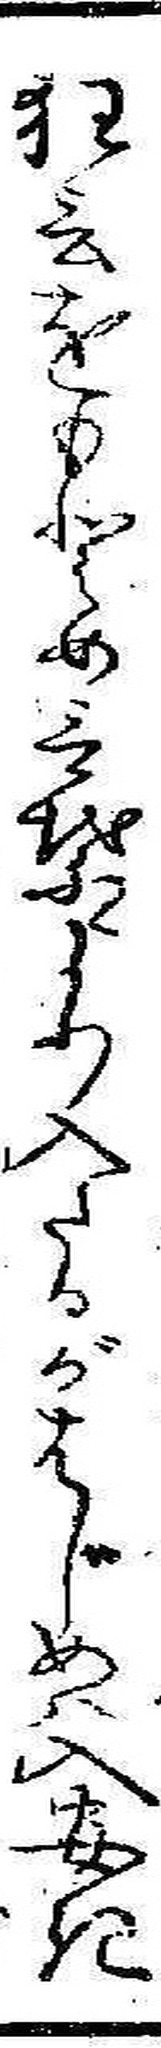狂言をもとめ言葉より入たるがはじめは入安き
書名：狂哥はまのきさご
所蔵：国文学研究資料館
